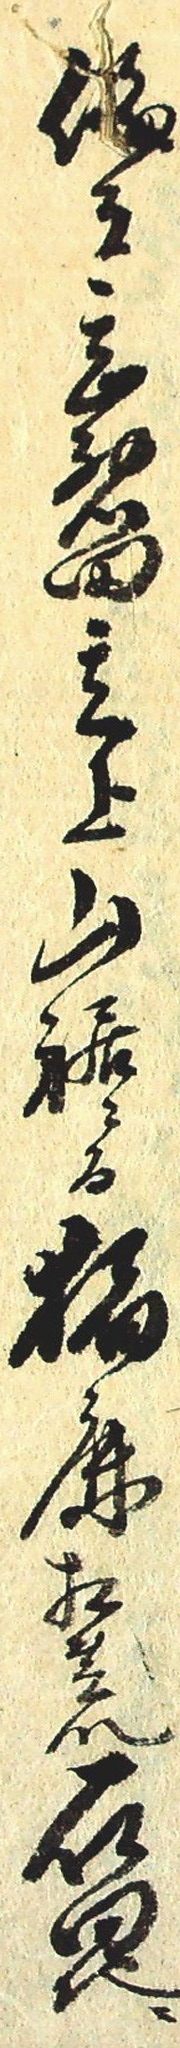儀は甚悪田其上山裾にて猪鹿相荒右田地に
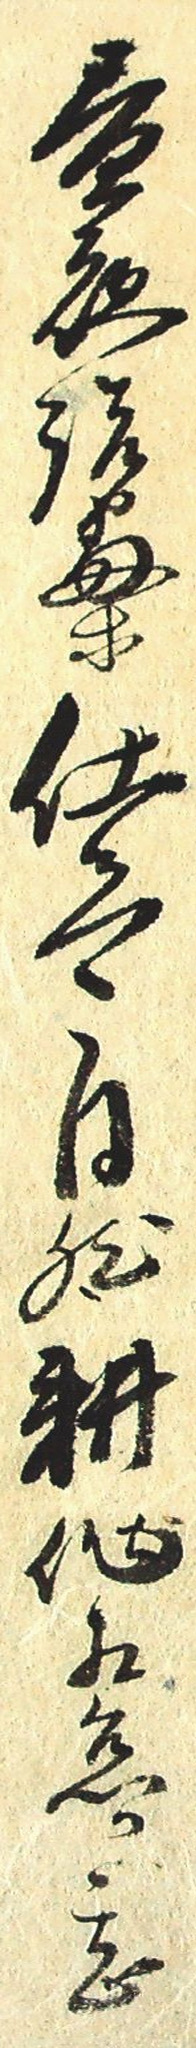昼夜詰番等仕候はゝ自然耕作相怠り甚

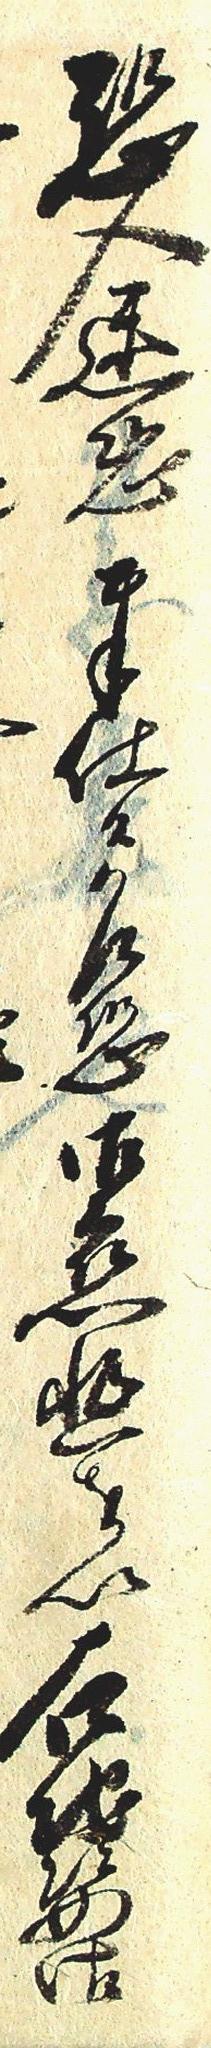恐入迷惑奉仕候乍恐御慈悲を以右地姿御
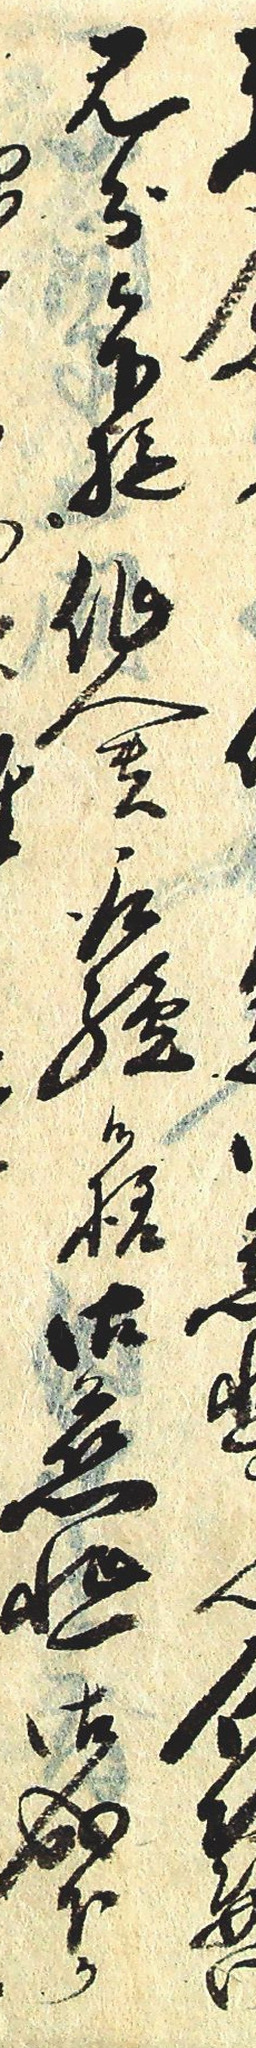見分被下遊作人共取続候様御慈悲御成下り
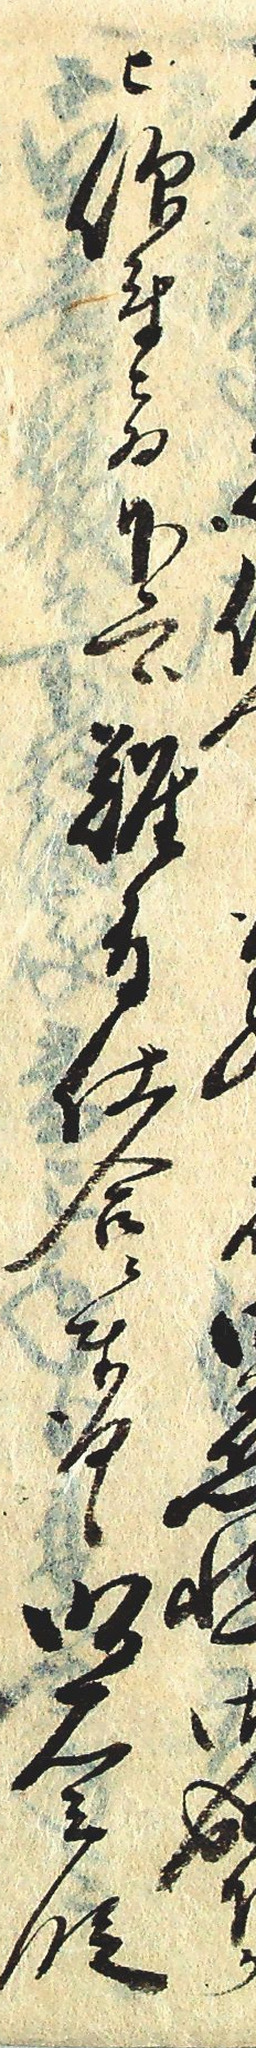被仰付被為下候へは難有仕合に奉存候仍て右之段
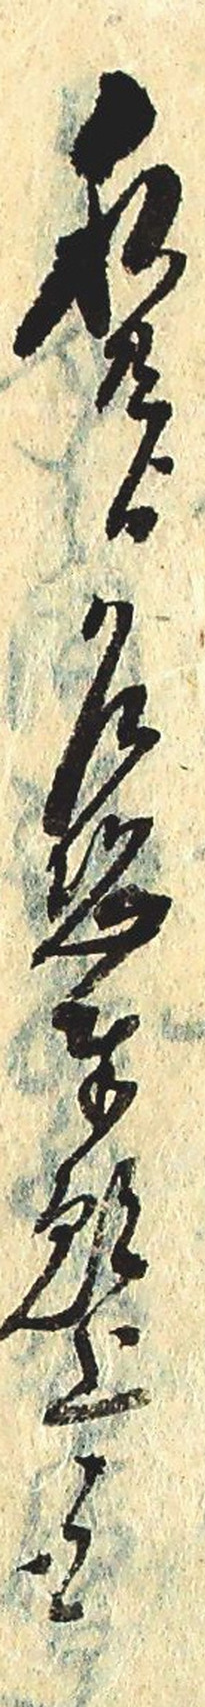私共ゟ乍恐奉願上候以上
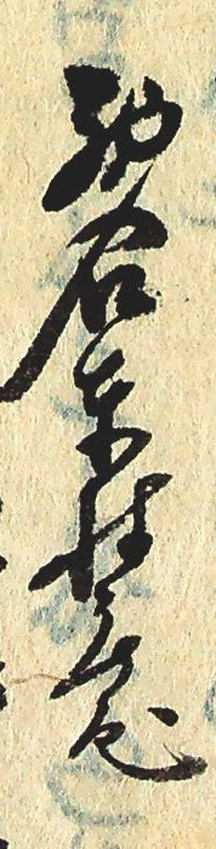西名東村庄屋
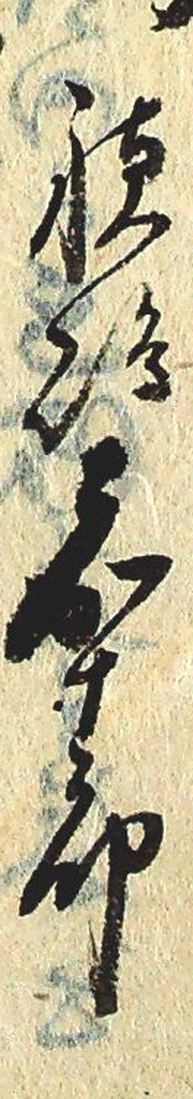禎島嘉十郎
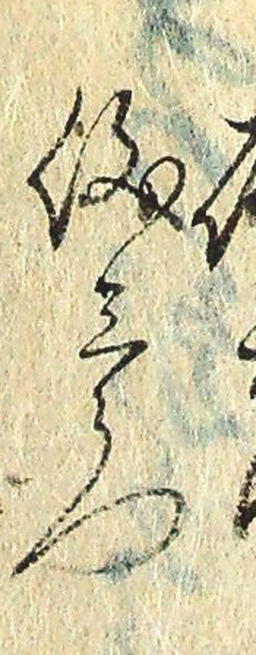同儀右衛門
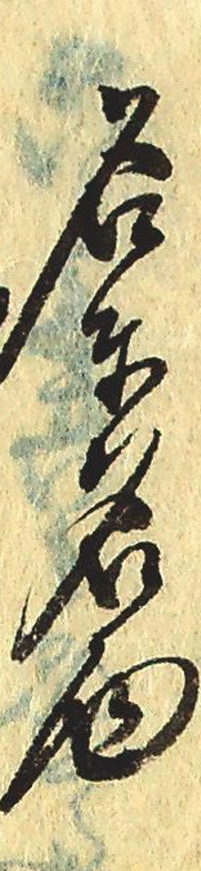名東名西
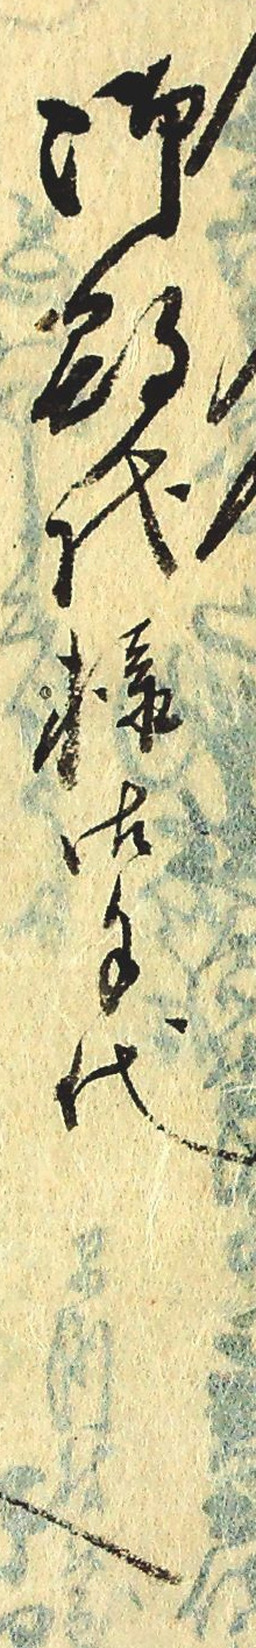御郡代様御手代
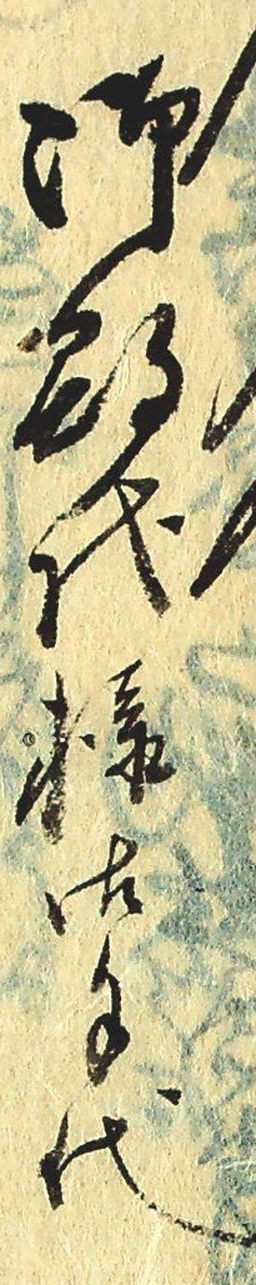御郡代様御手代
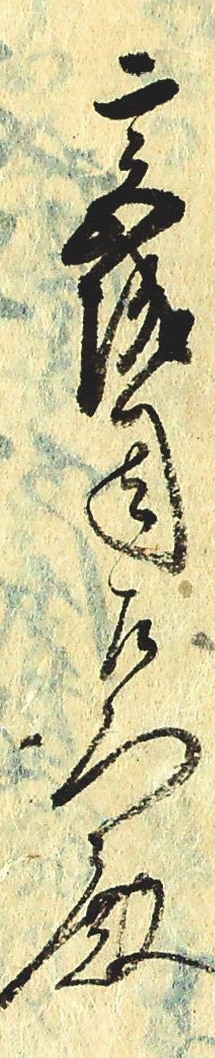宮城周左衛門殿

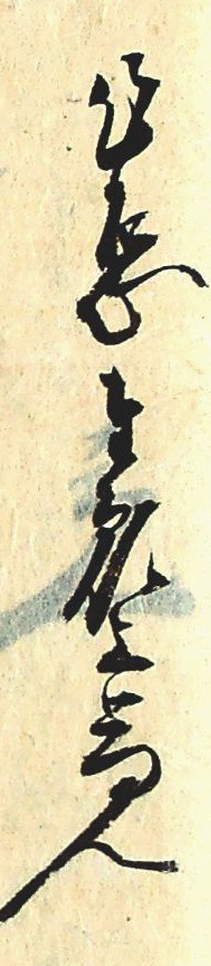乍恐奉願上覚
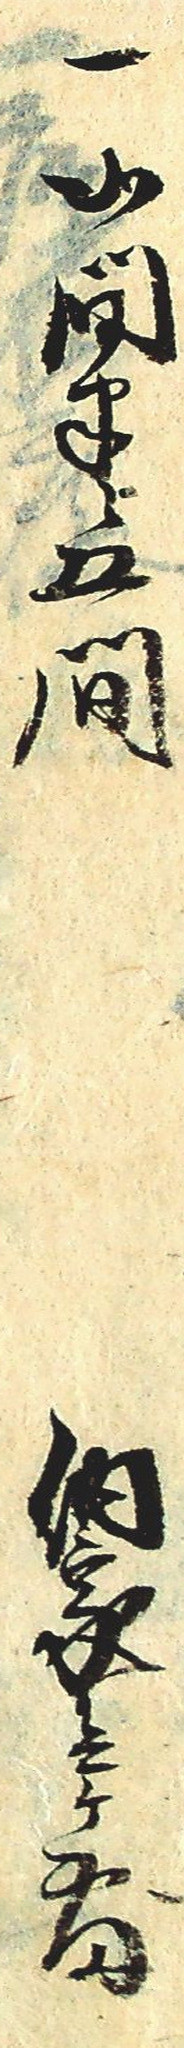一弐間半に五間納家壱ヶ処
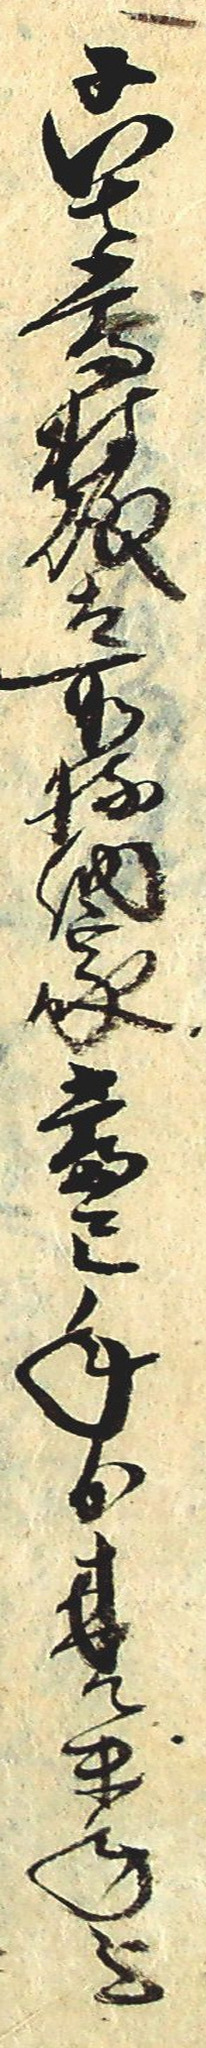右は当村磯太所持納家当巳年ゟ来る未年迄
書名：諸御願書控(弐番）
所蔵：鳴門教育大学 Naruto University of Education
